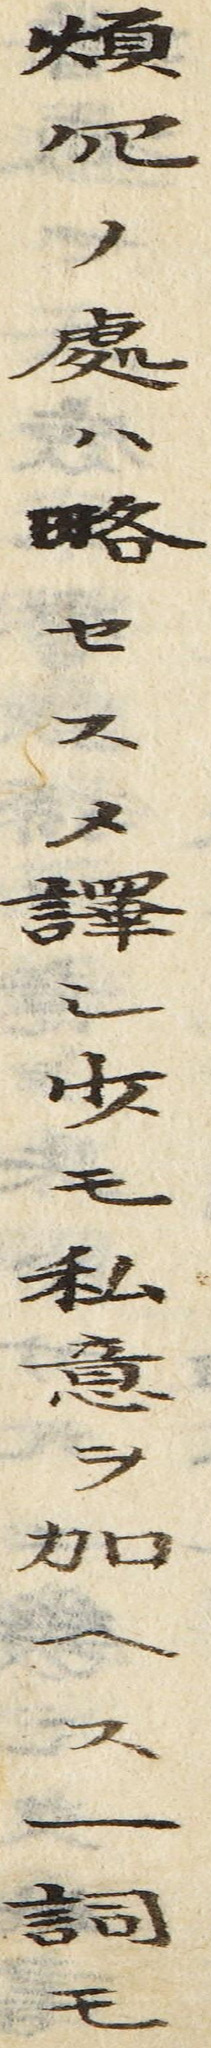煩冗ノ処ハ略セスシテ訳シ少モ私意ヲ加ヘス一詞モ

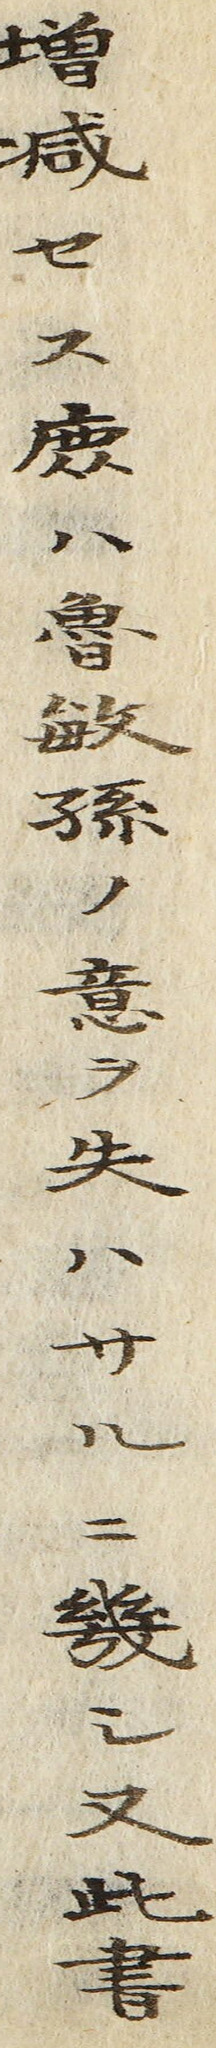増減セス庶ハ魯敏孫ノ意ヲ失ハサルニ幾シ又此書
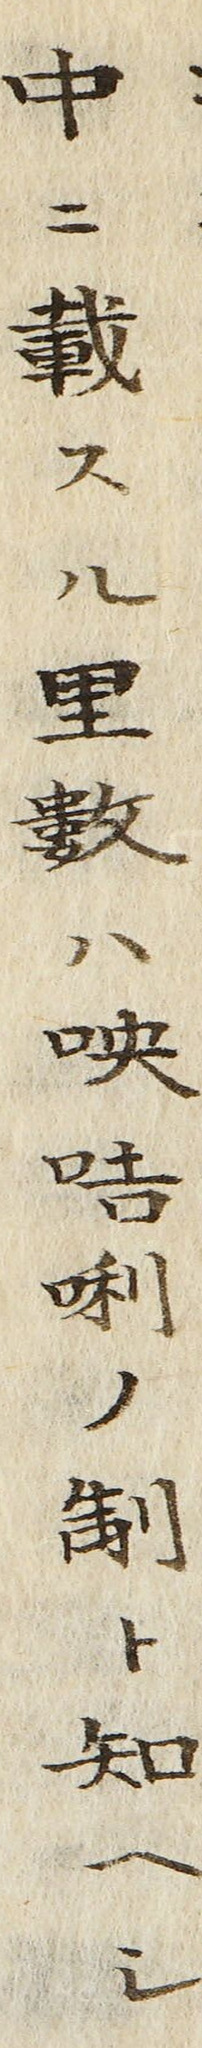中ニ載スル里数ハ咉咭唎ノ制ト知ヘシ
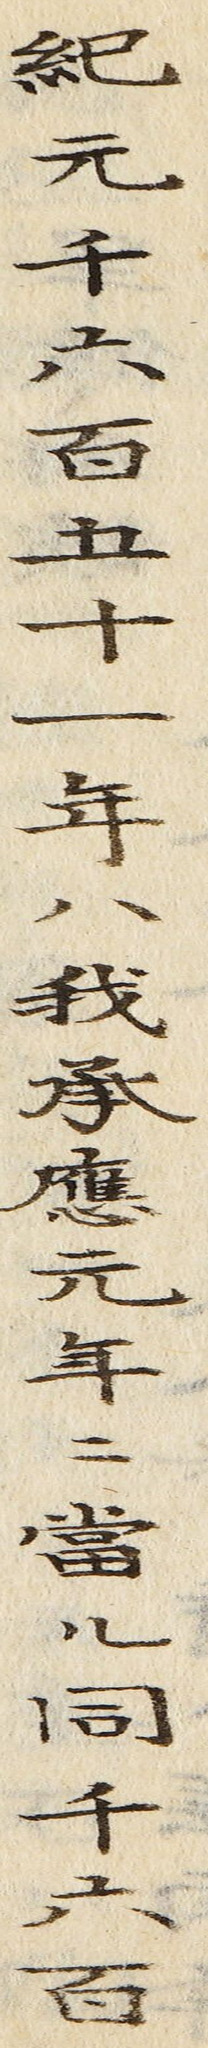紀元千六百五十一年ハ我承応元年ニ当ル同千六百
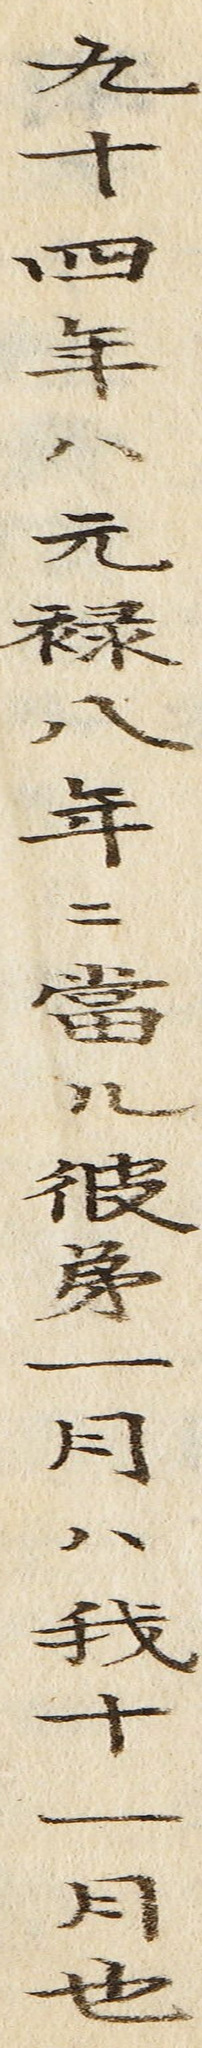九十四年ハ元禄八年ニ当ル彼第一月ハ我十一月也
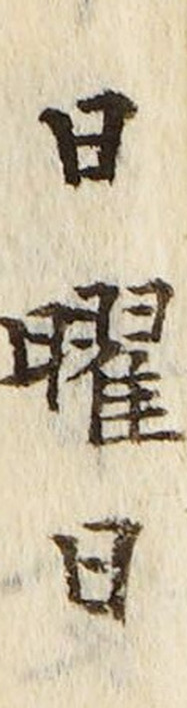日曜日
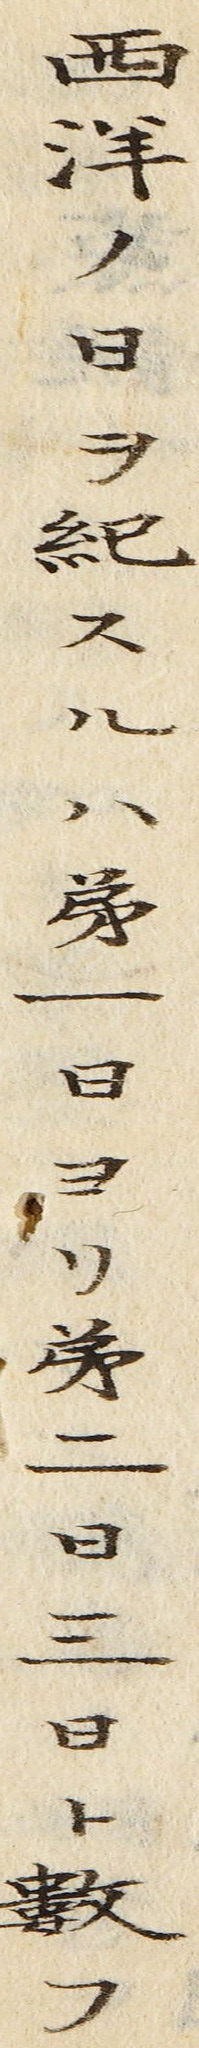西洋ノ日ヲ紀スルハ第一日ヨリ第二日三日ト数フ
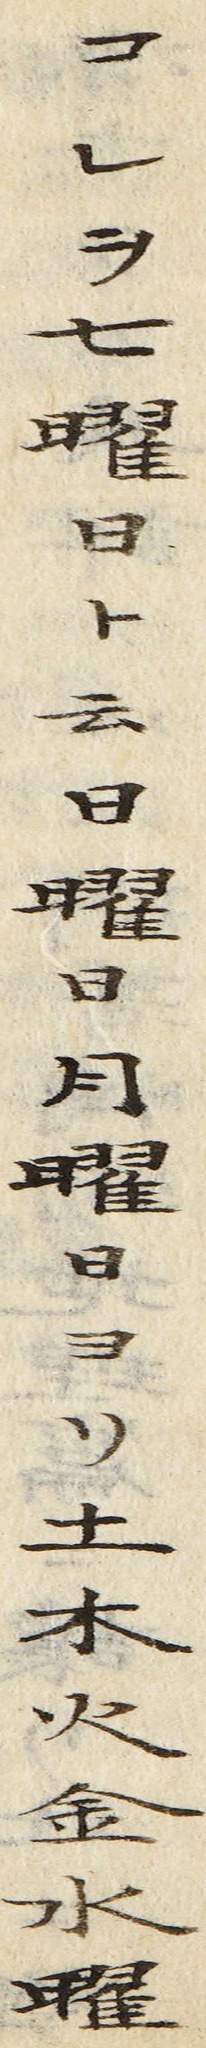コレヲ七曜日ト云日曜日月曜日ヨリ土木火金水曜
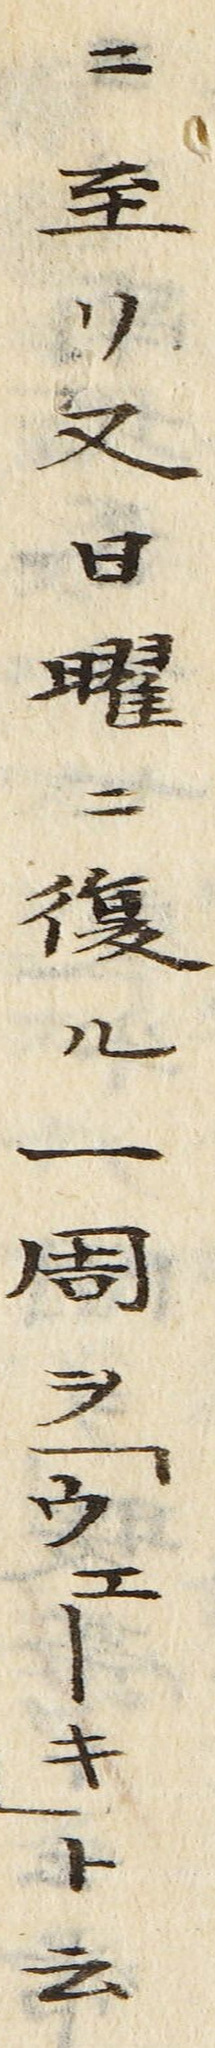ニ至リ又日曜ニ復ル一周ヲ「ウェーキ」ト云
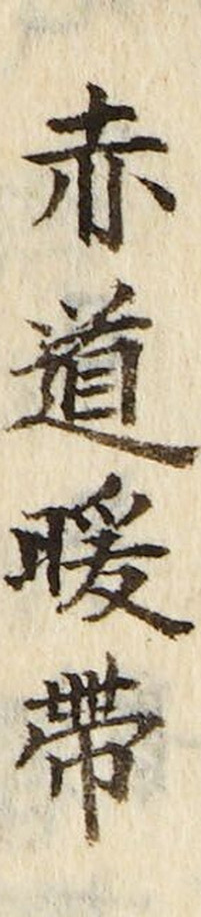赤道暖帯
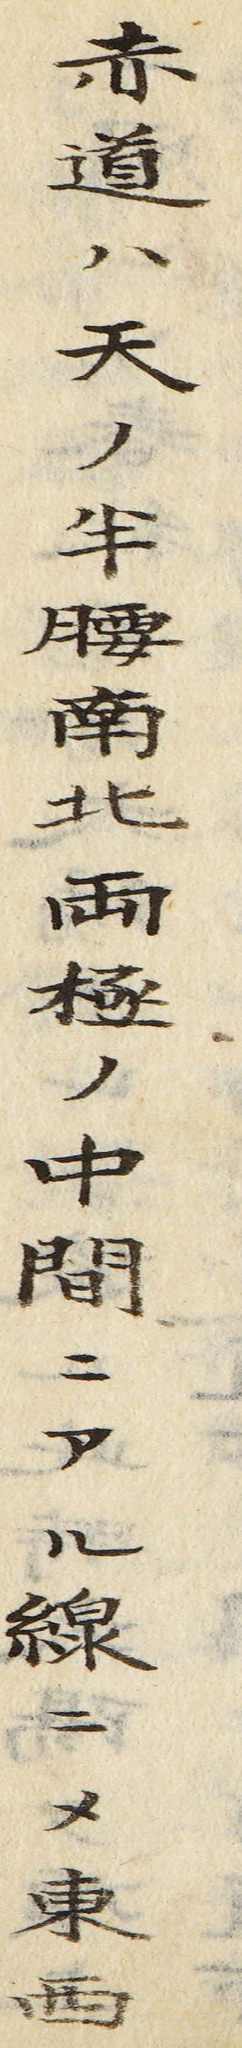赤道ハ天ノ半腰南北両極ノ中間ニアル線ニシテ東西

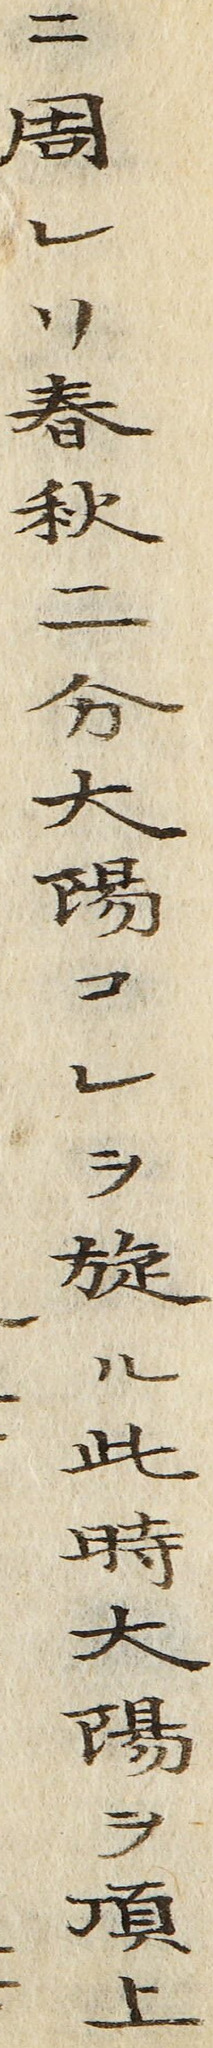ニ周レリ春秋二分大陽コレヲ旋ル此時大陽ヲ頂上
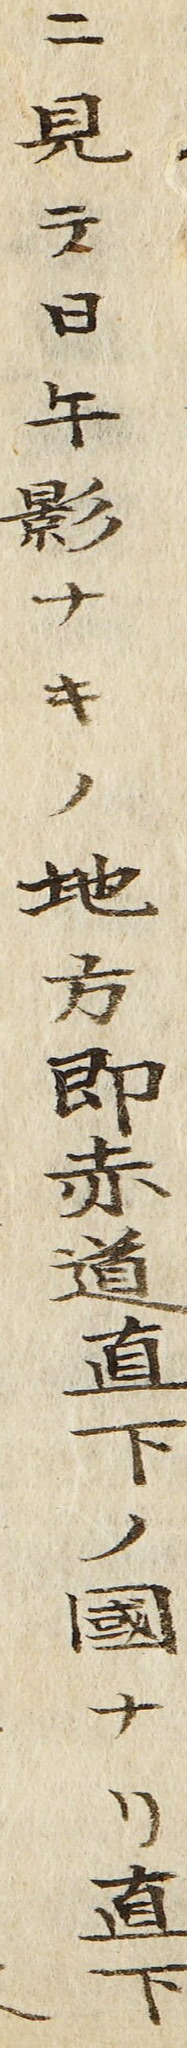ニ見テ日午影ナキノ地方即赤道直下ノ国ナリ直下
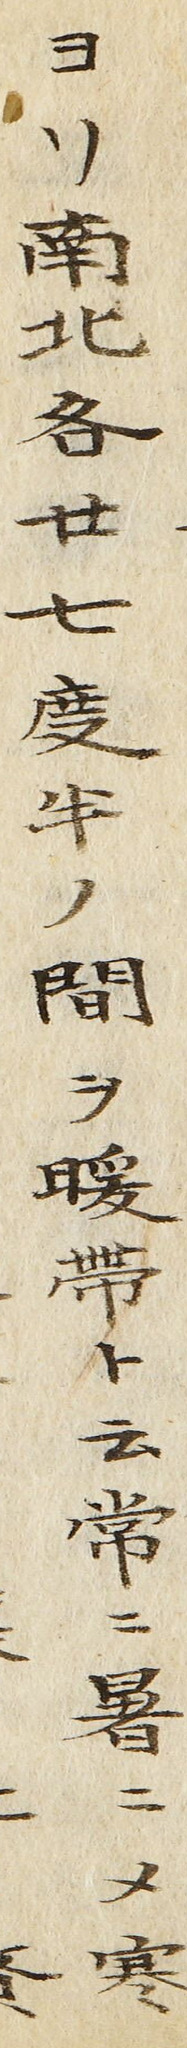ヨリ南北各廿七度半ノ間ヲ暖帯ト云常ニ暑ニシテ寒
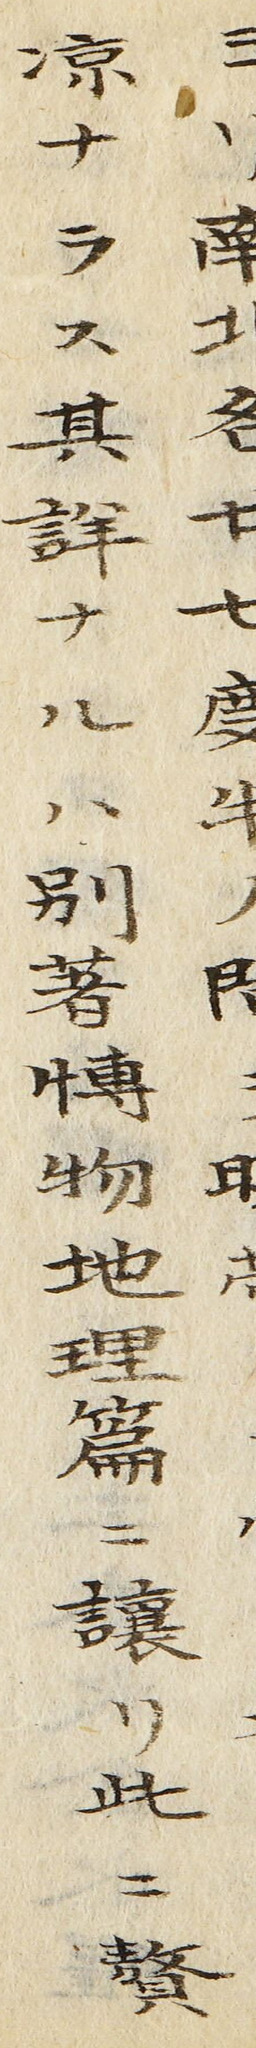涼ナラス其詳ナルハ別著博物地理篇ニ譲リ此ニ贅
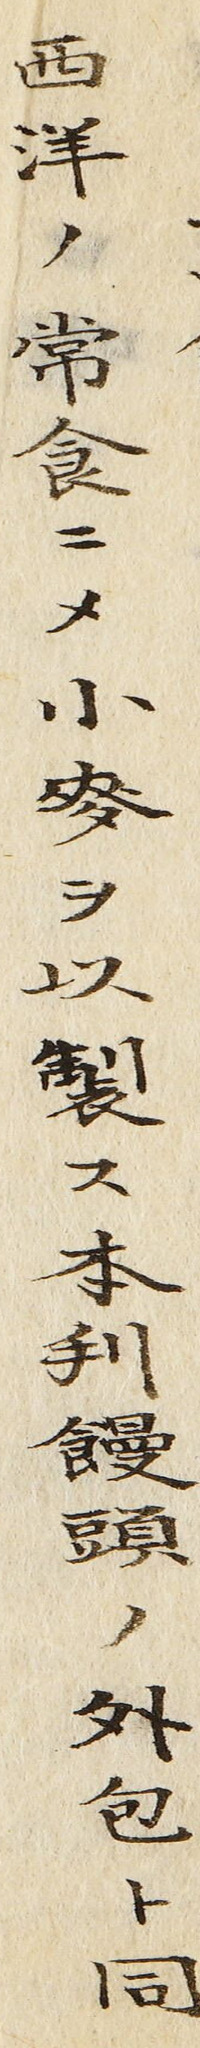西洋ノ常食ニシテ小麦ヲ以製ス本邦饅頭の外包ト同
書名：漂流紀事
